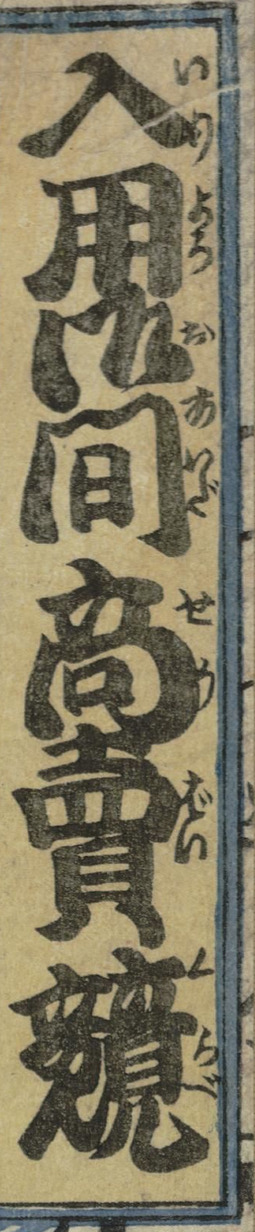入用御間商売競
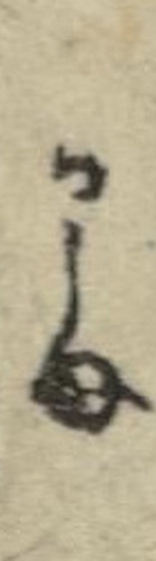かしま
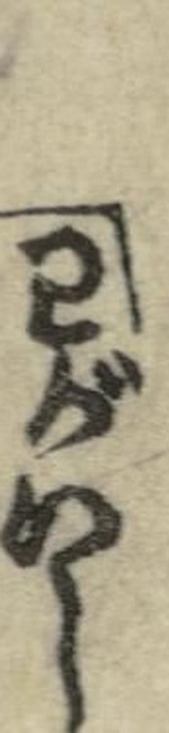〽わがいし
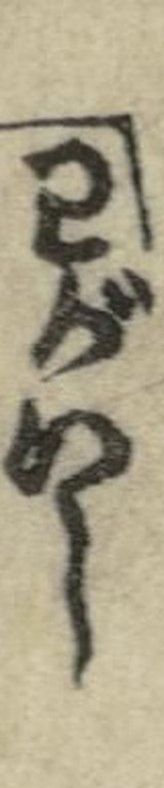〽わがいし
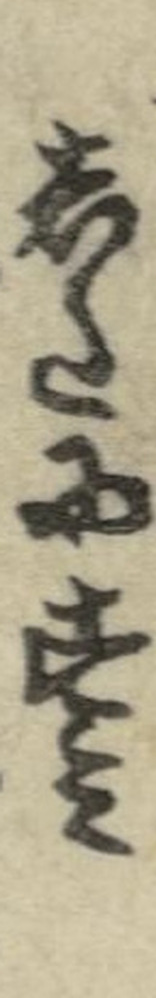したにすみ
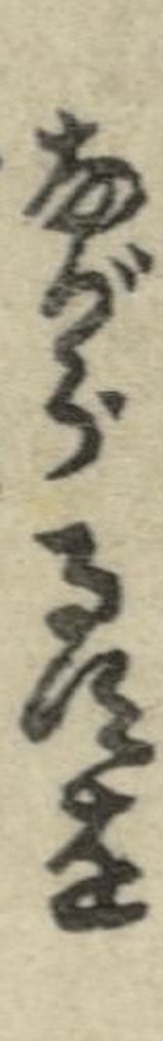ながらるすを
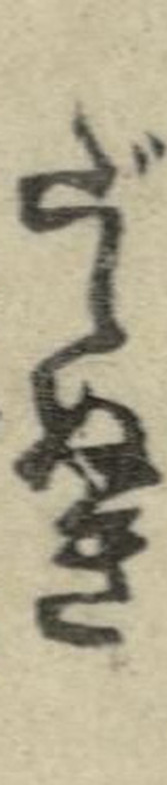だしぬき
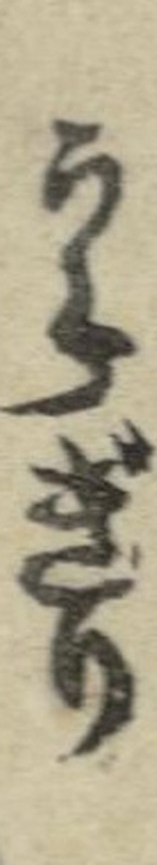うらぎり
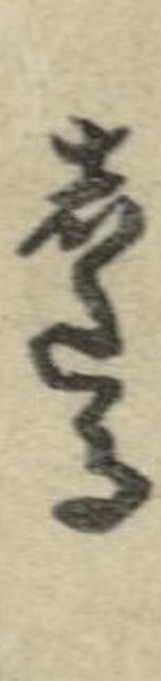したる
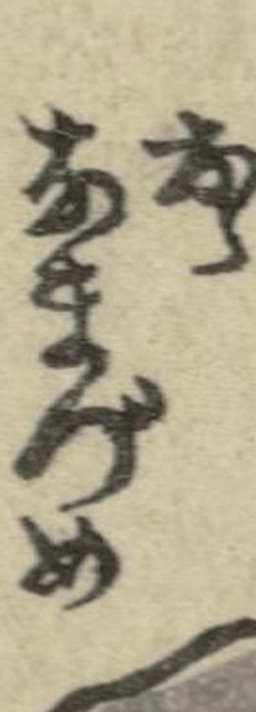なまづめ
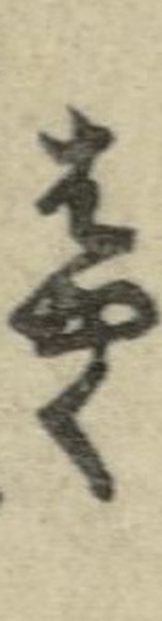はやく
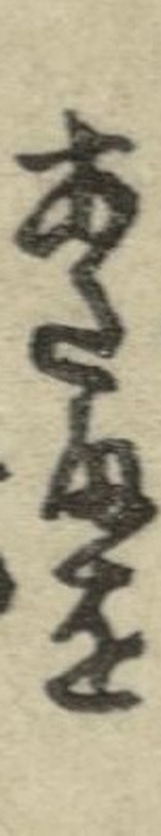あたまを
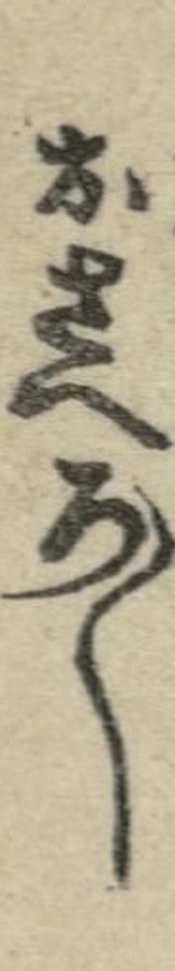おさへろ〳〵
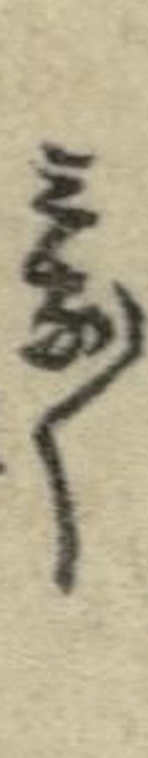みな〳〵
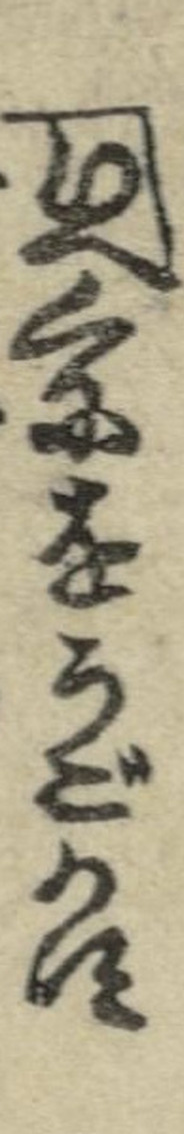〽いへくにをうごかす
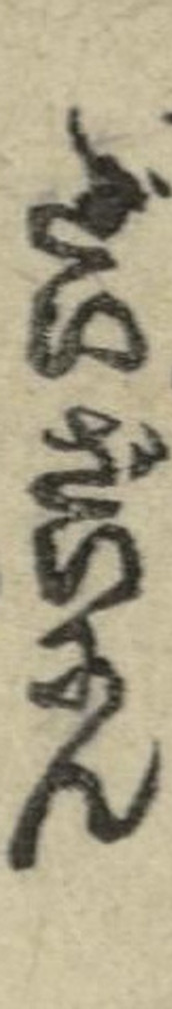だいざいにん
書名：入用御間商賣競
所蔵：東京大学地震研究所図書室 Earthquake Research Institute Library, The University of Tokyo, JAPAN
